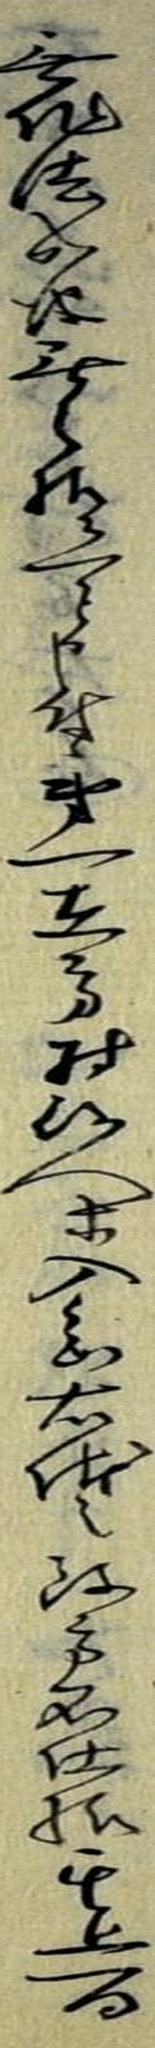無作法成儀無之様に可被申付候第一在方村役人等入念右体之致方不仕様其上百
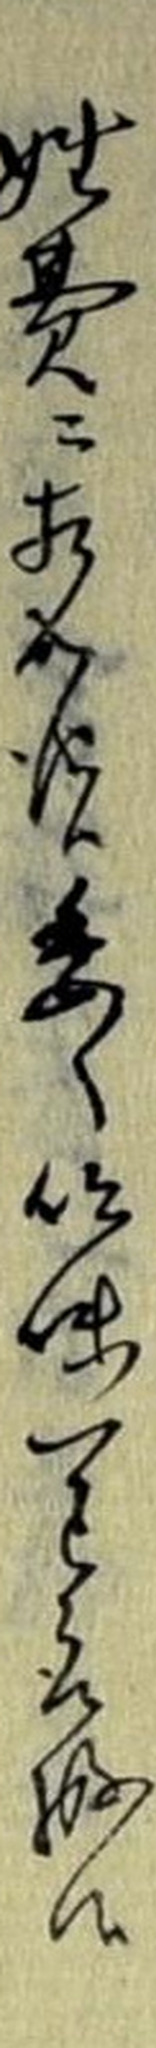姓費に相成儀は委く吟味可被取扱候
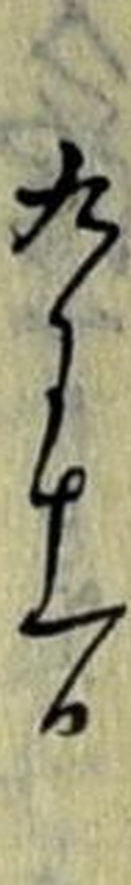九月十一日
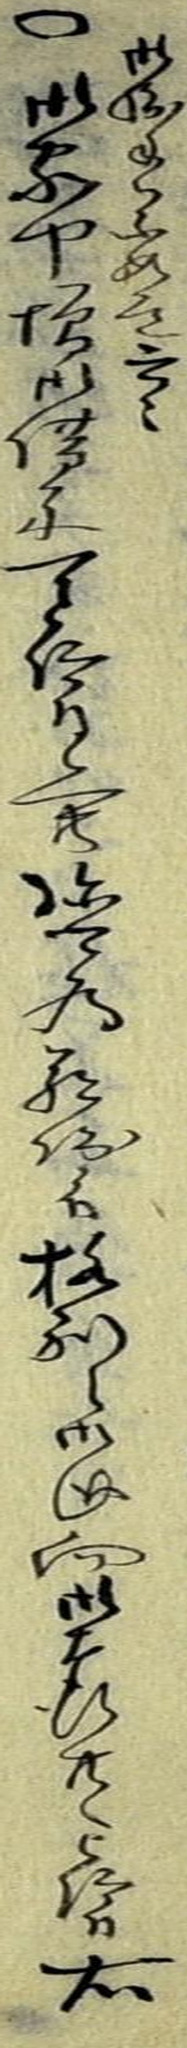〇御家中増御借米可被仰付候へ共弥可為難儀に付格別之御趣向御奉行共へ被仰付右
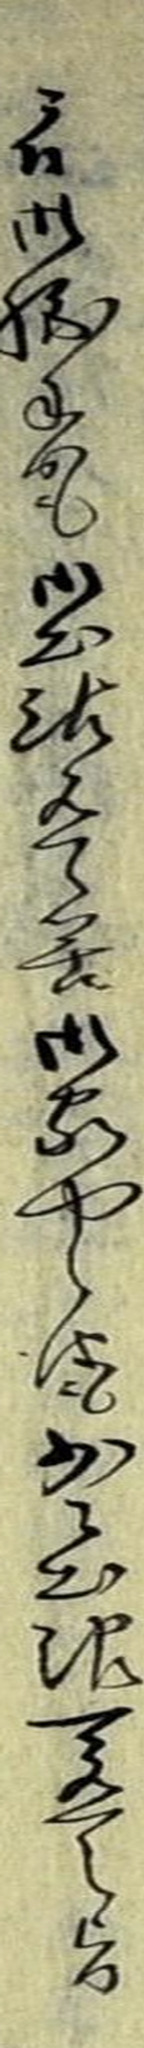に付御勝手ゟも御出銀有之筈御家中之儀も少々出銀可有之旨
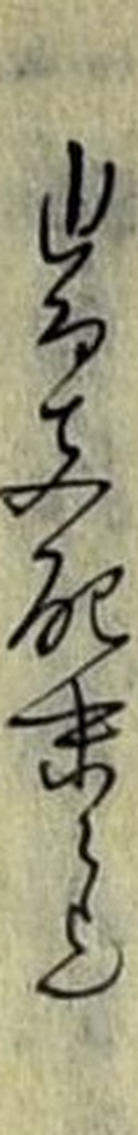追而支配末々迄
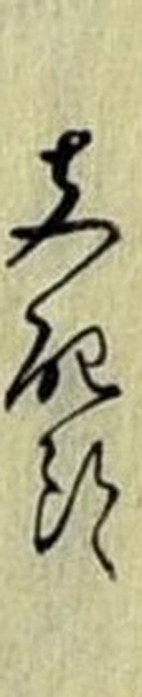支配頭へ
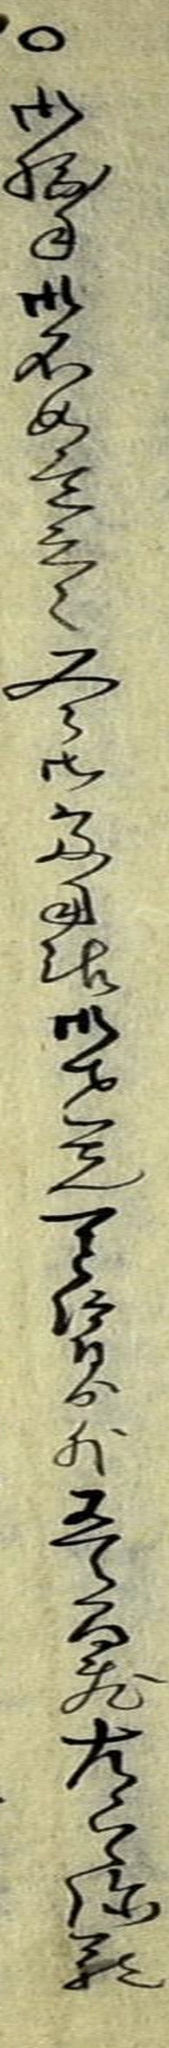〇御勝手御不如意云々又々御当用銀御才覚可被仰付ゟ外有之間敷左候はゝ弥難
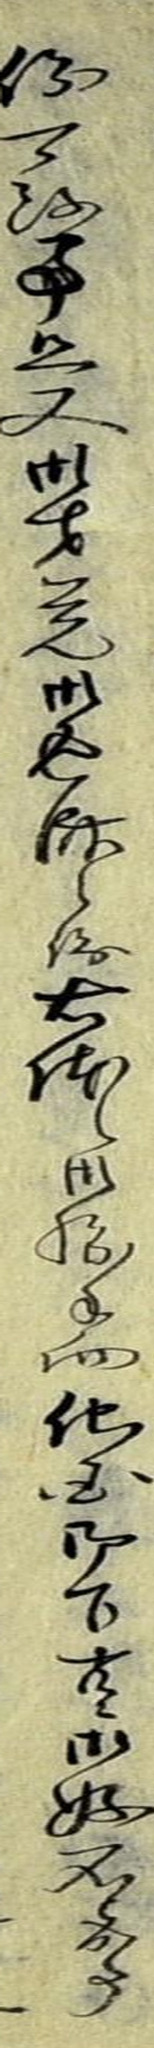儀可致事且又御才覚御返済之儀右之体之御勝手向他国御下共に御好不被成事
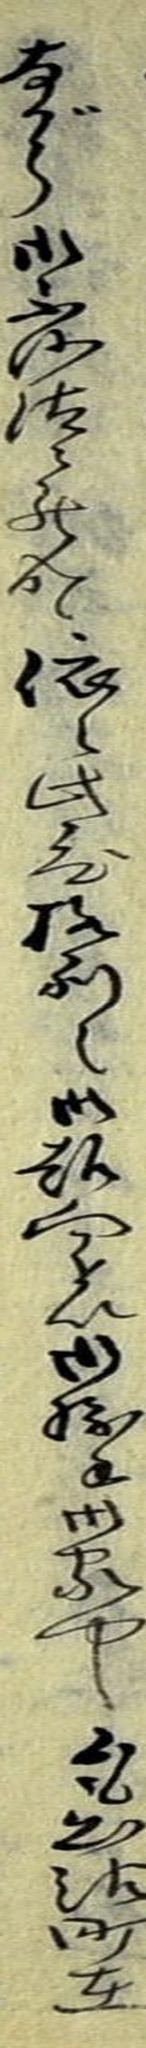ながら御不沙汰に罷成候依之此度格別之御趣向を以御勝手御家中ゟも出銀町在
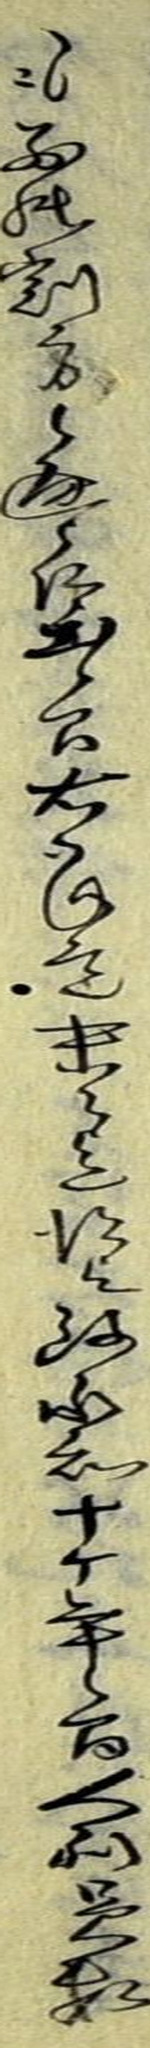へも別紙割方之通被仰出候間右御趣意末々迄得与致承知十ヶ年之間人別員数
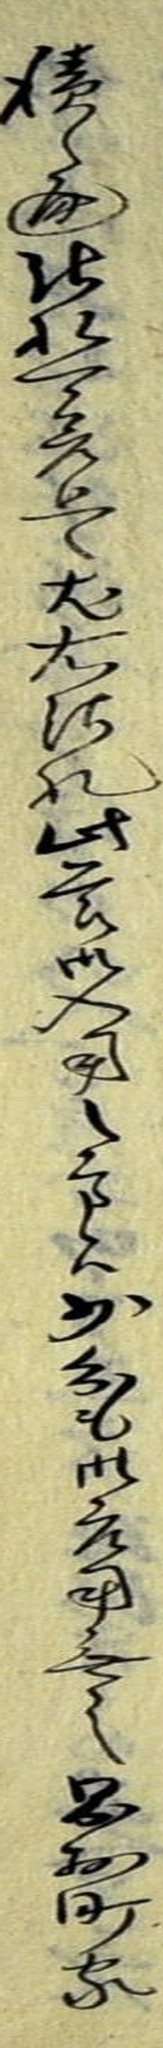積之通銀札可差上候尤右銀札此節御入用之方へは少分も御取用無之則於町家

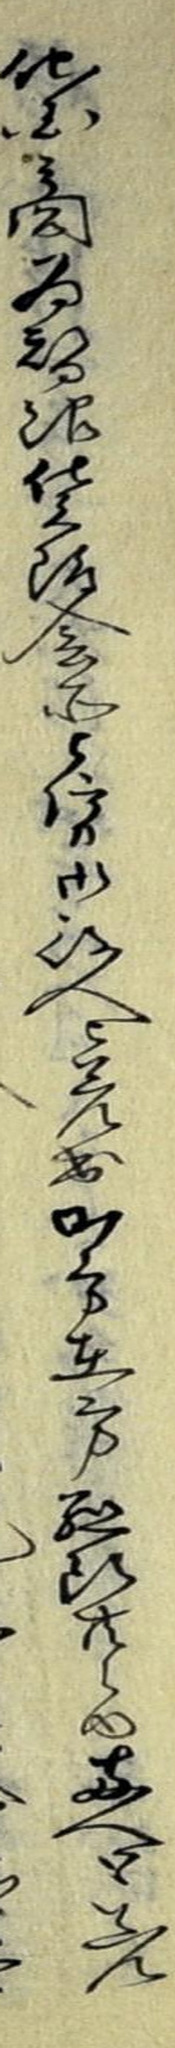他国商為替銀貸附会所被仰付御役人被差出町方在方組頭共之内両人ツヽ差
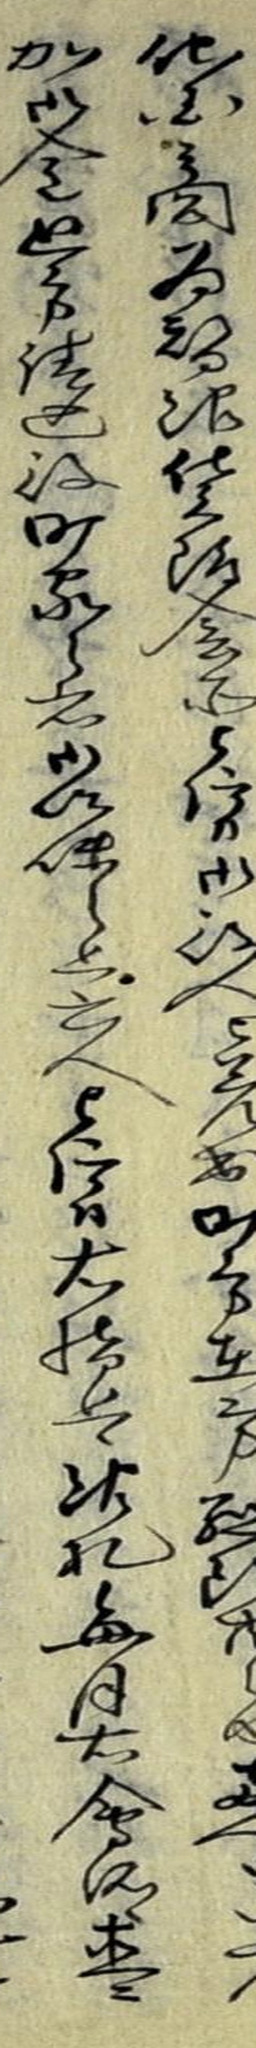加御金廻方請込役町家之者御吟味之上六人被仰付右指上候銀札毎月右会所へ直に
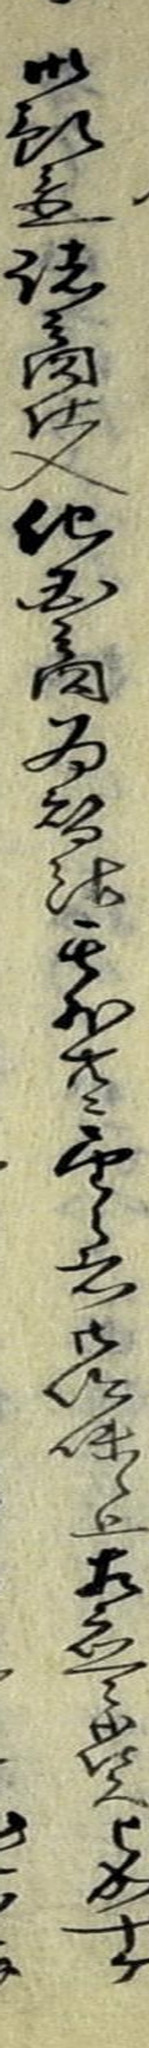御預置諸商仕入他国商為替銀其外共に届之者御吟味之上相応に御貸被成十ヶ
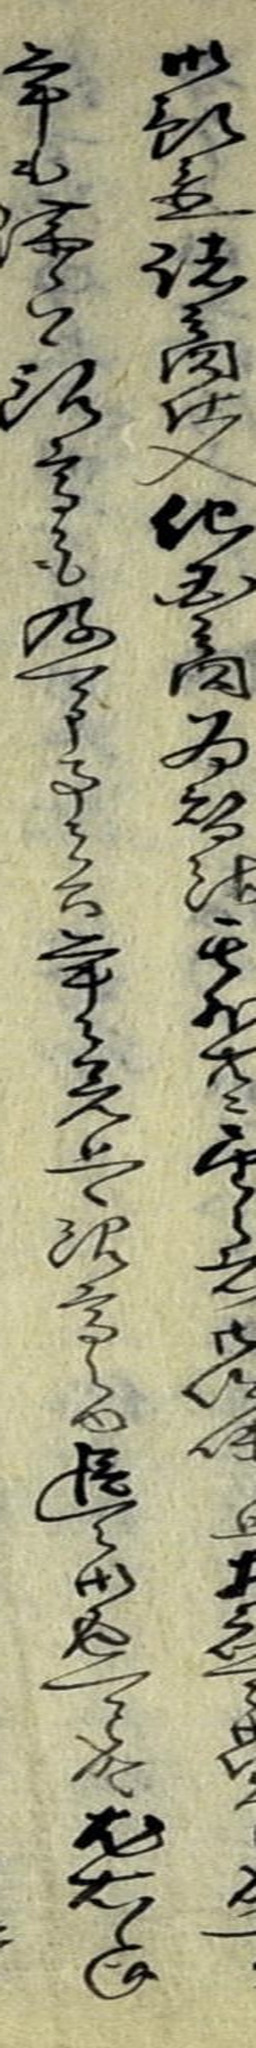年も満候はゝ銀高にも及可申事に候間年々差上候銀高之内追々御返可被成候尤右之趣
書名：命令之部 二
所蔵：福井県文書館 Fukui Prefectural Archives
